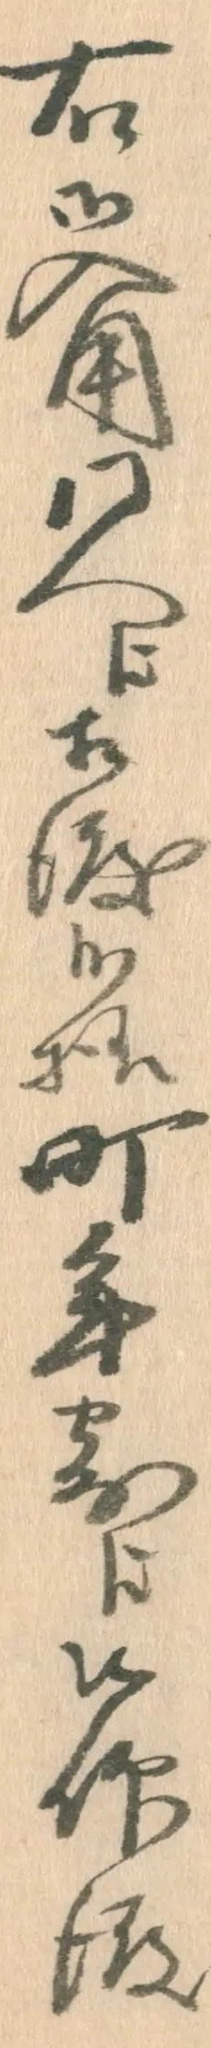右御入用同人え相渡候様町年寄え被仰渡
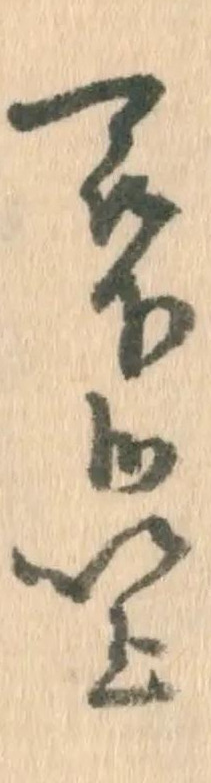可被下候以上
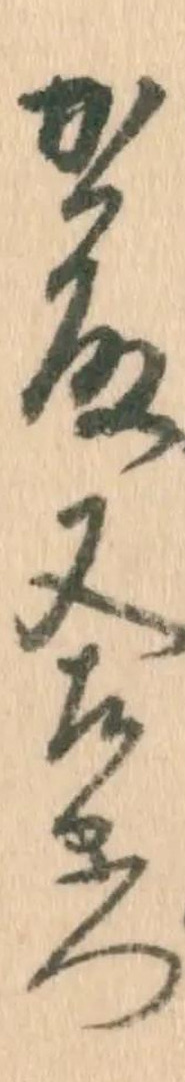加藤又左衛門
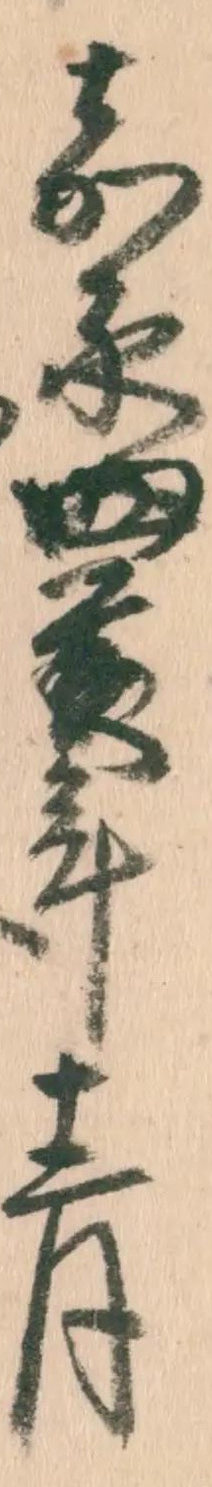嘉永四亥年十二月
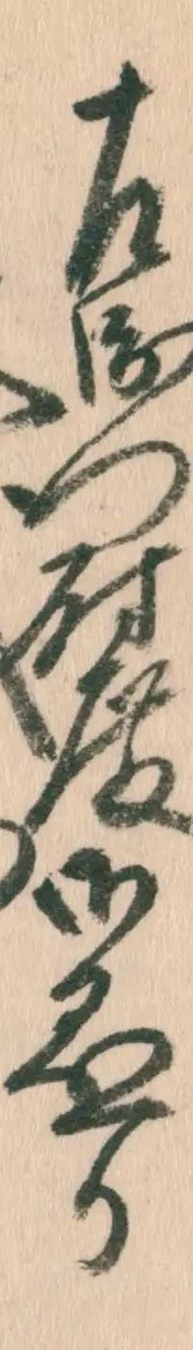左衛門尉殿御懸り

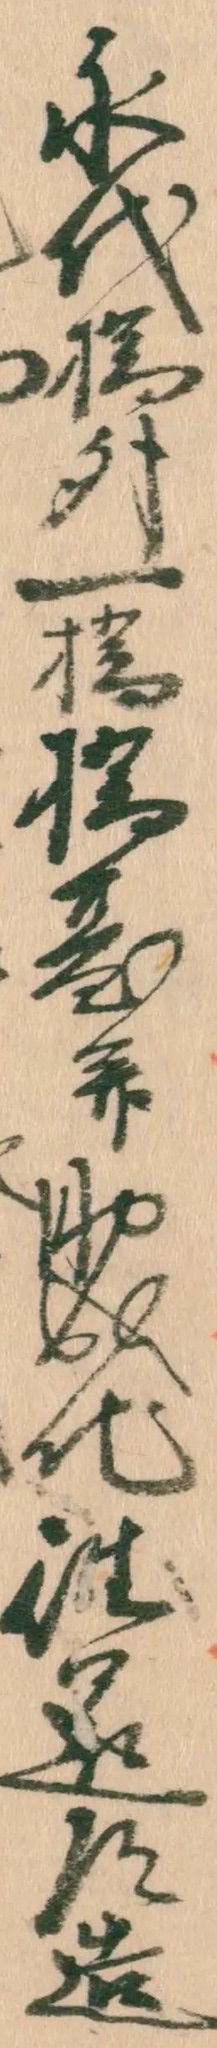永代橋外一橋橋台并助成地往還道造
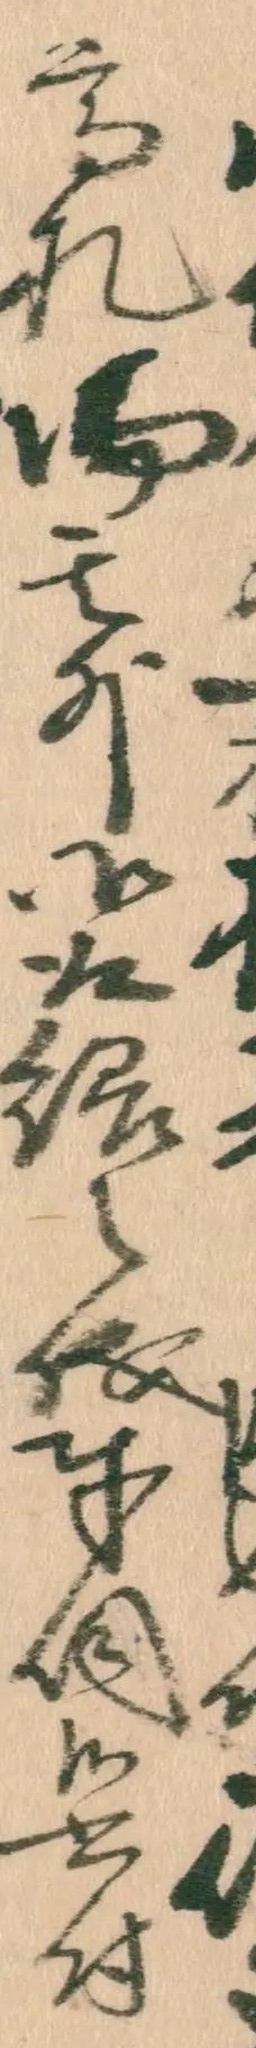高札場其外御取繕之儀奉伺候書付
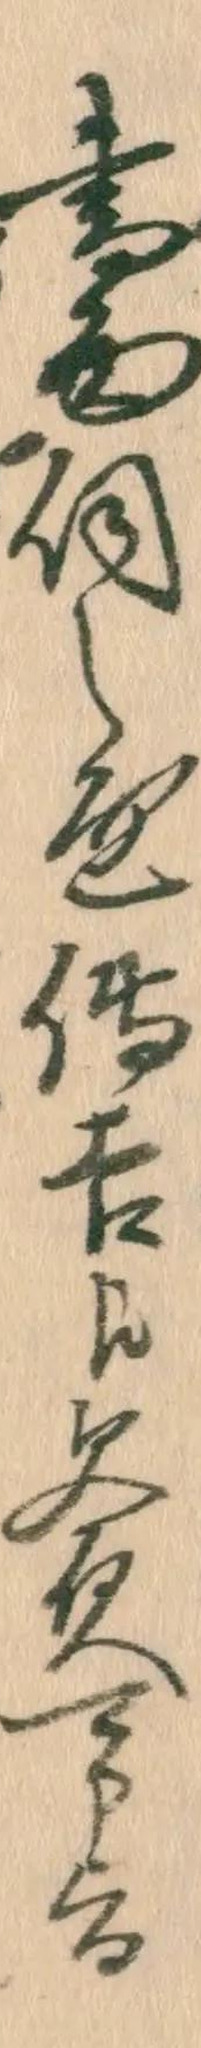書面伺之通伝吉え受負可申旨
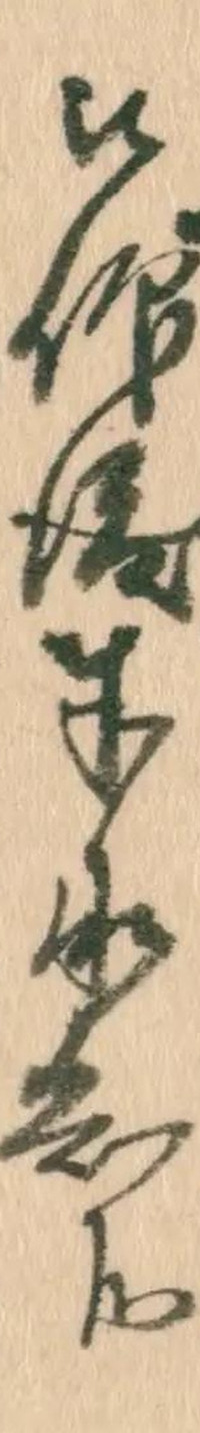被仰渡奉承知候
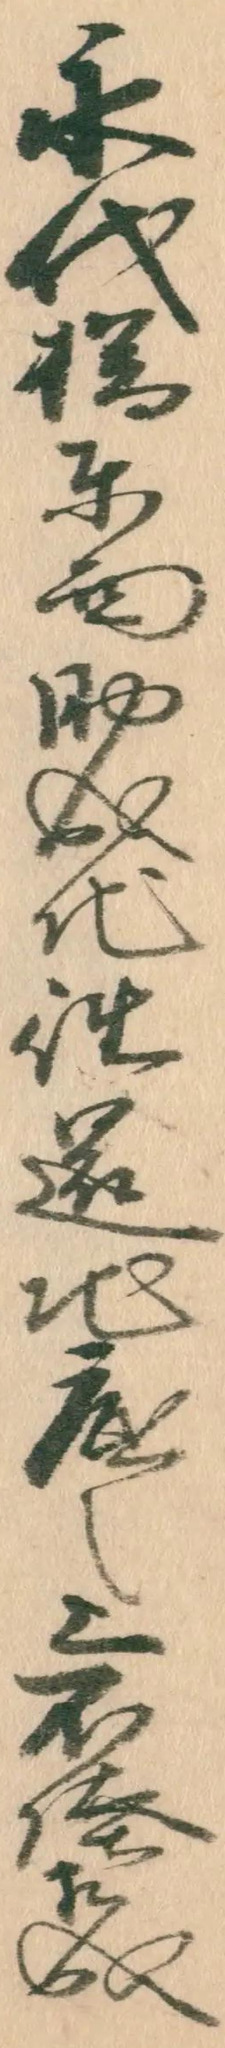永代橋東西助成地往還地底之上不陸相成
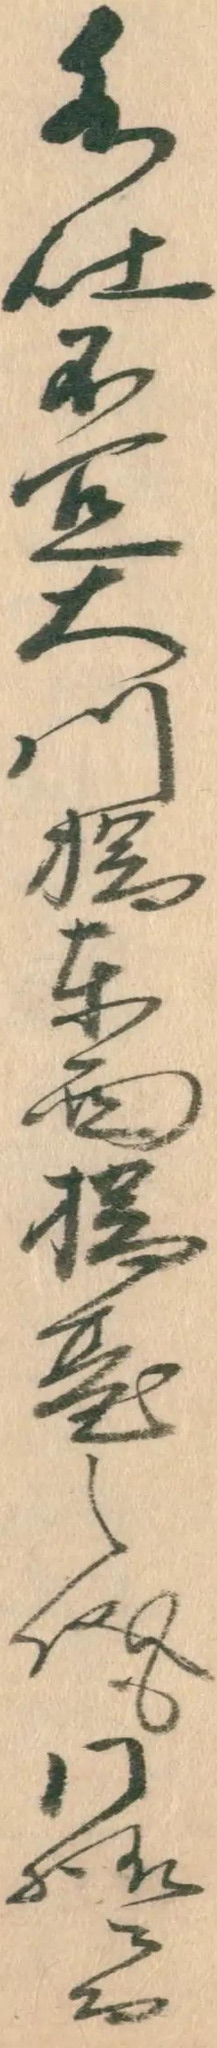水仕不宜大川橋東西橋台之儀も同様ニ而

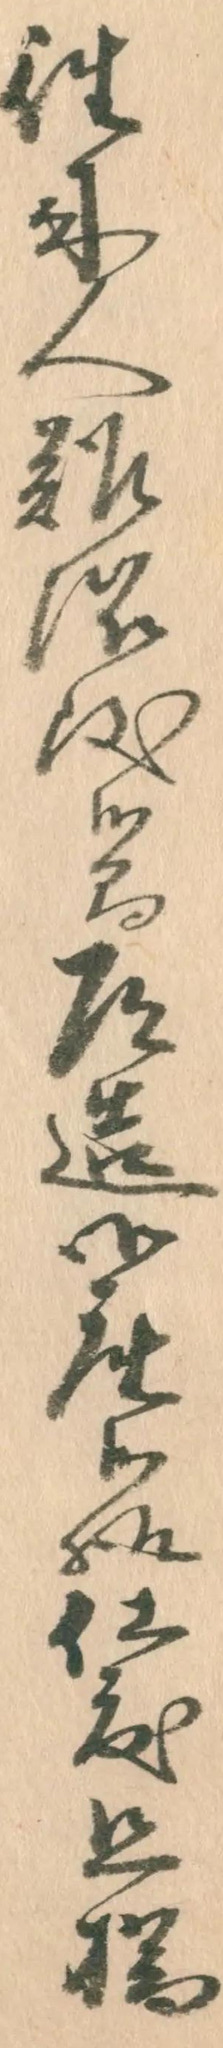往来人難渋致候間道造御座候様仕度且橋
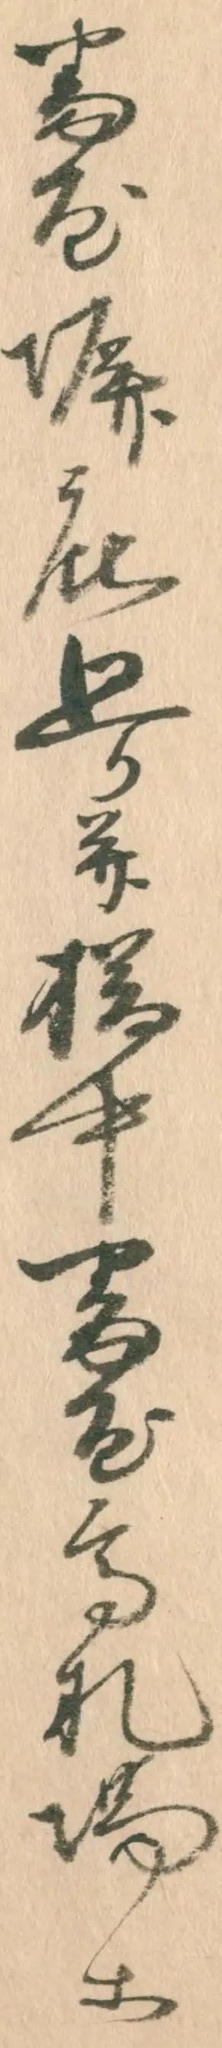番屋塀庇廻り并橋中番屋高札場等
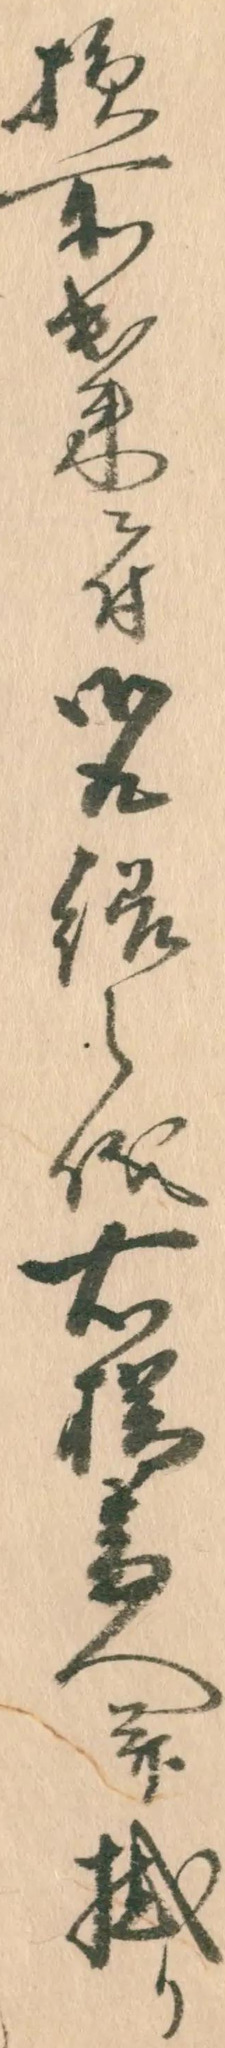損所出来ニ付御取繕之儀右橋番人并掛り
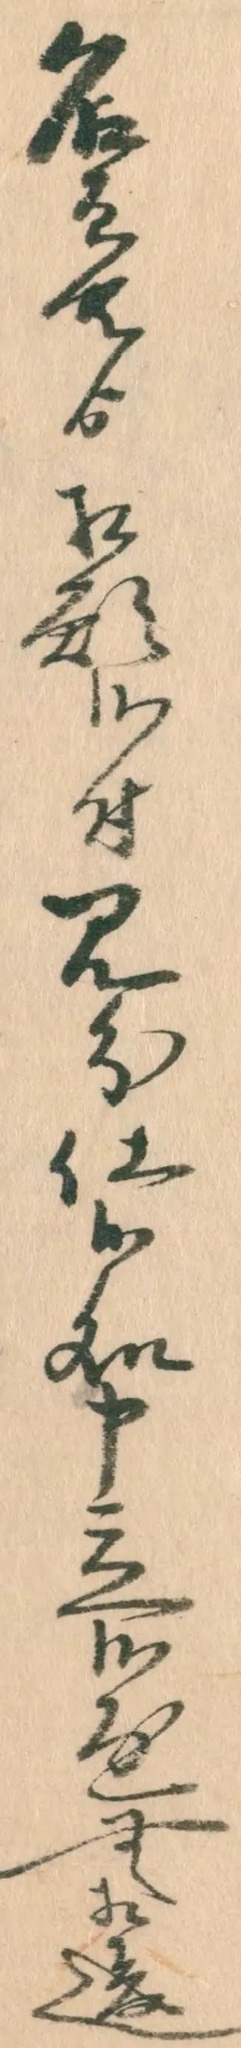名主共ゟ相願候付見分仕候処申立候通無相違
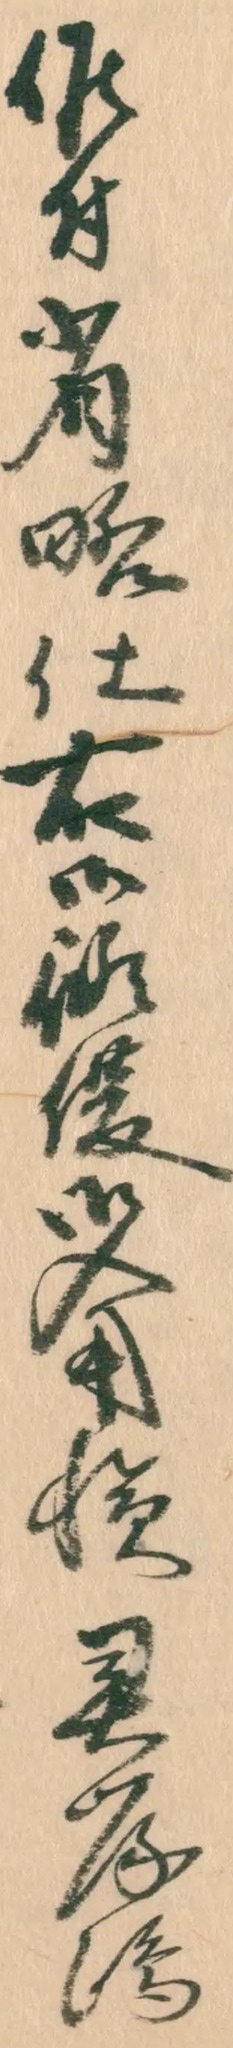候付省略仕右御修復御入用積霊岸島
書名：三橋 17巻. [7] 三橋小破御修復書留　但御奉行御掛リ替地震潰橋番屋　嘉永四亥年より安政二卯年迄　上
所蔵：国立国会図書館 National Diet Library, JAPAN
